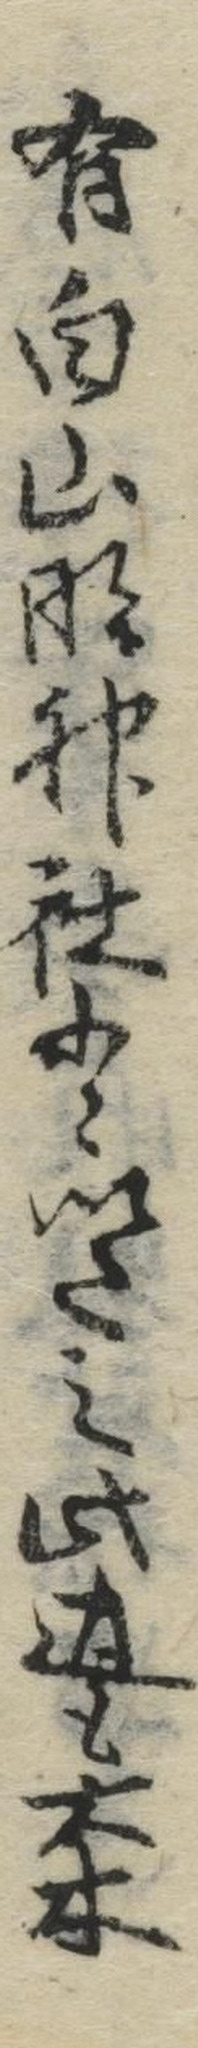有白山明神社少〻いたミ此辺も大木
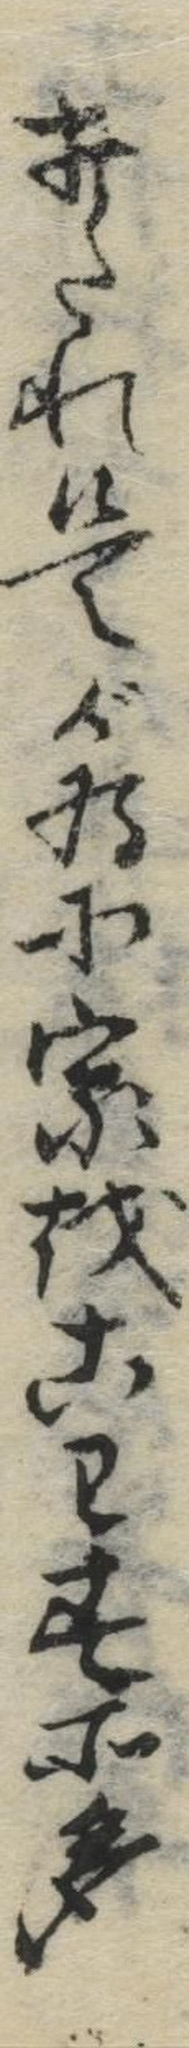打たれ候てが為に家をこわす所多
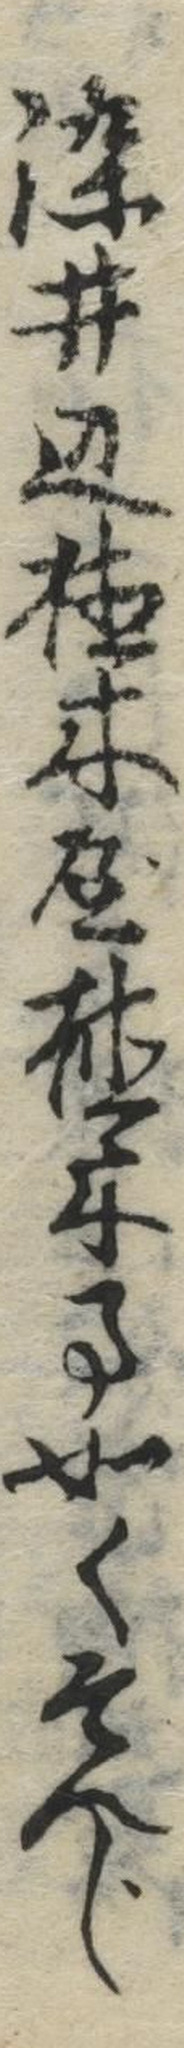染井邊植木屋植木事如くそんじ
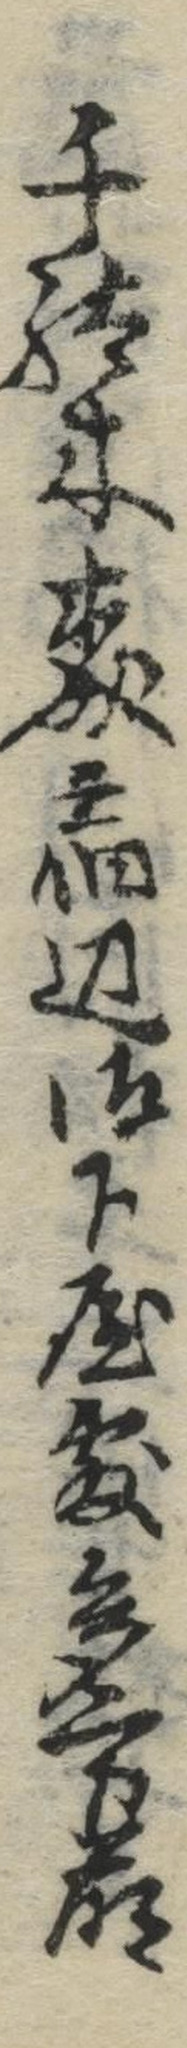千駄木森宿辺御下屋敷多方崩
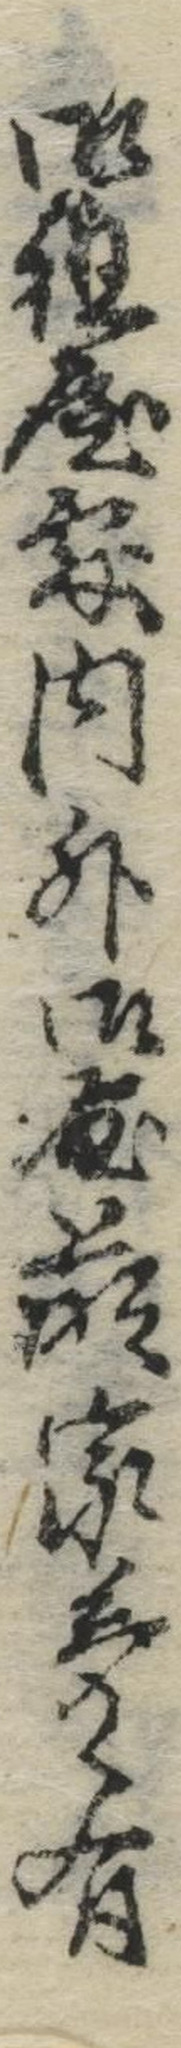御組屋敷内外御屋崩家多く有
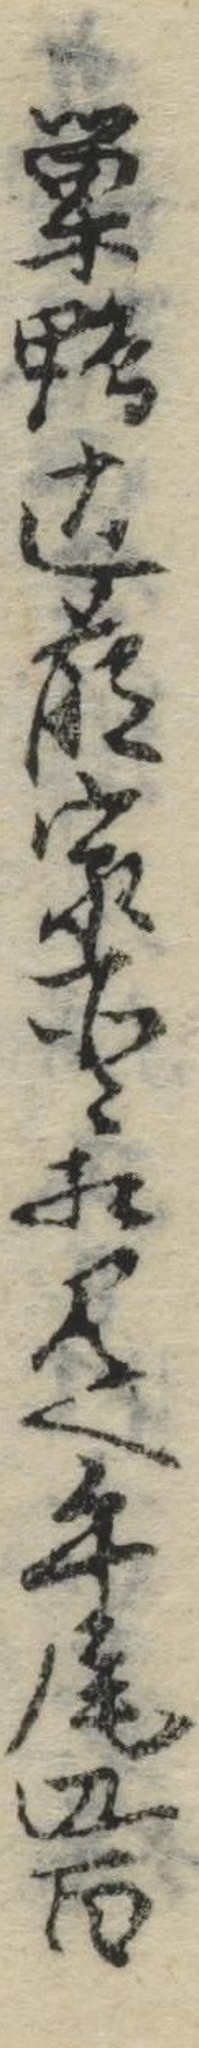巣鴨迄崩家所〻相見へ午尾辺百
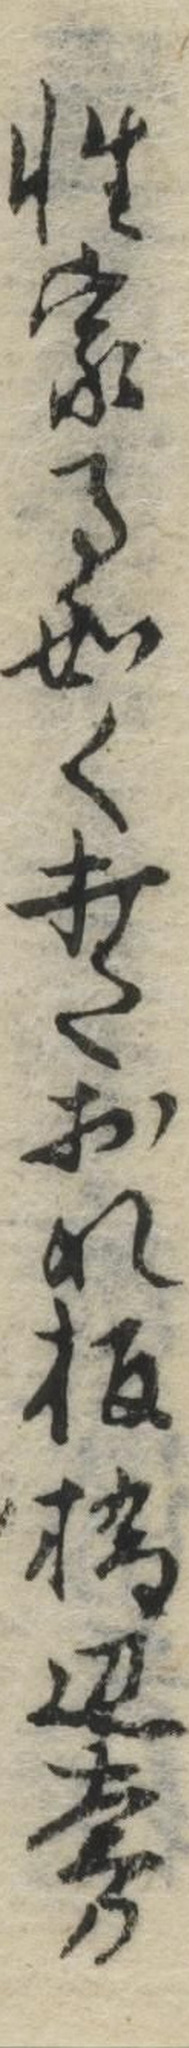性家事如く打たおれ板橋辺大方
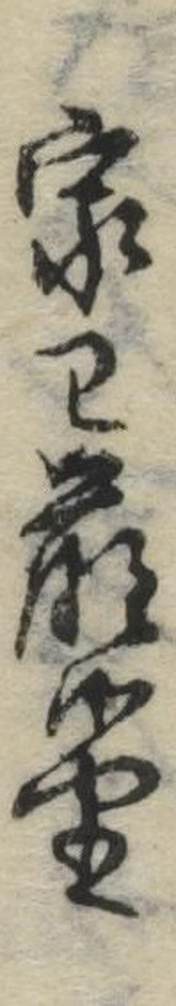家わ崩候由
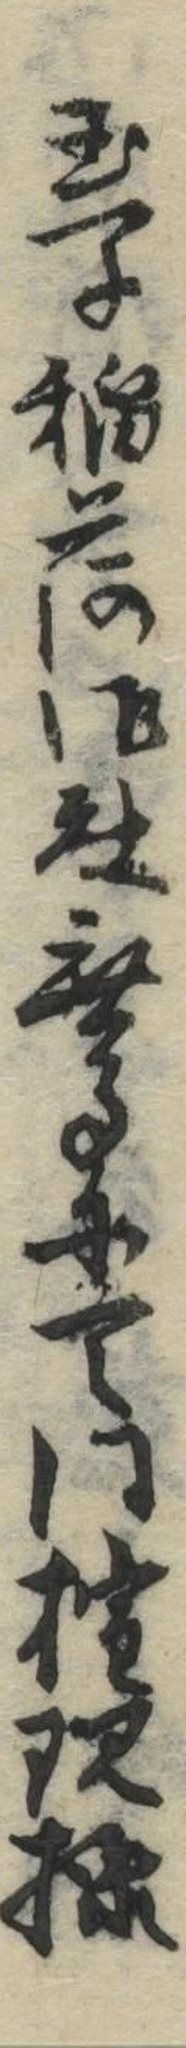王子稲荷御社無事にて同権現様
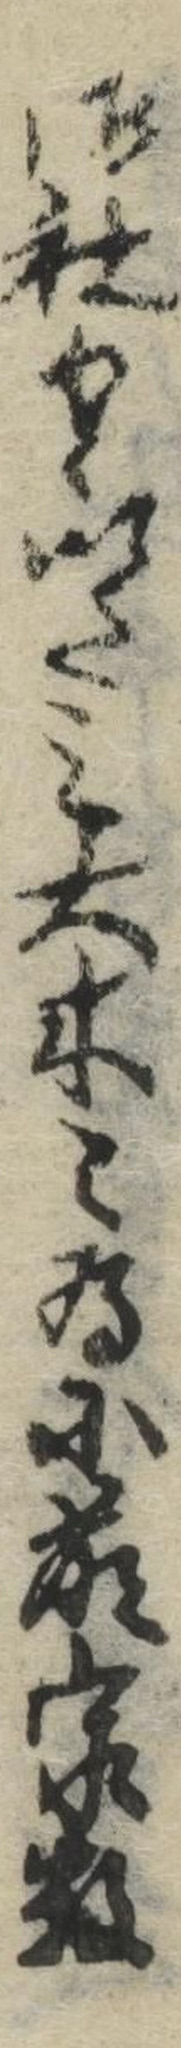御社少〻いたミ大木之為に崩家数
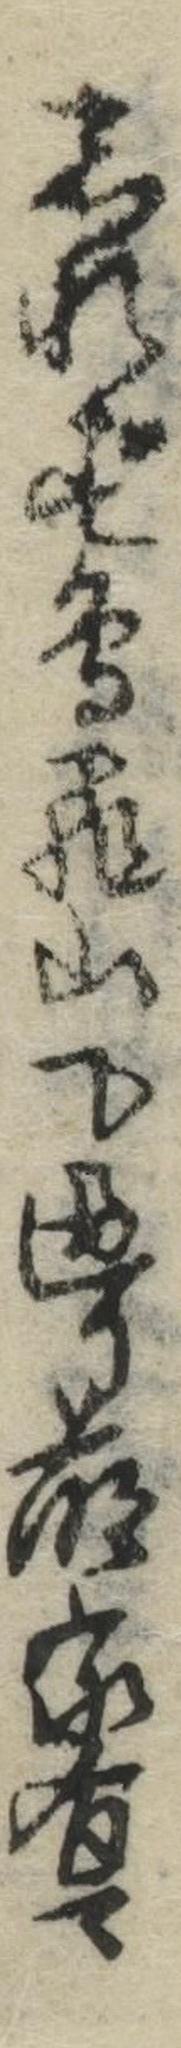しれす鳥飛山下通り崩家有て
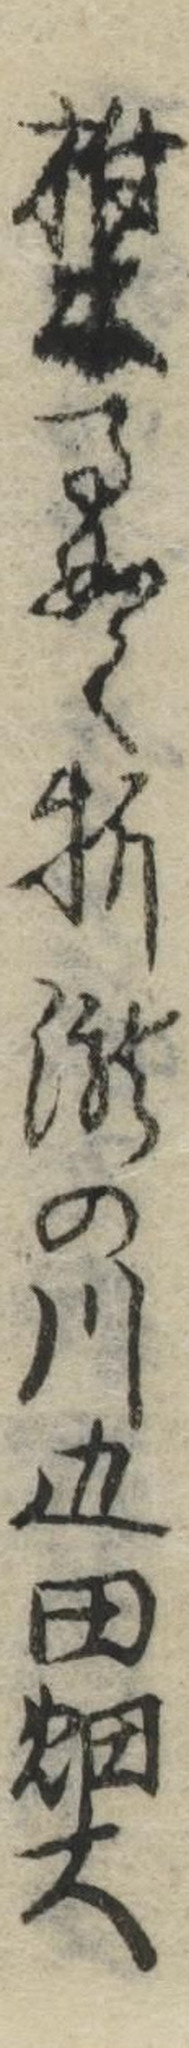椎木事如く折瀧の川辺田畑大
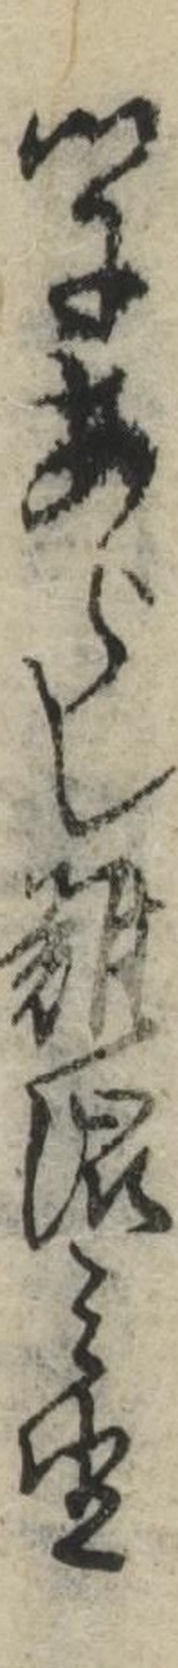いにあらし難渋之由
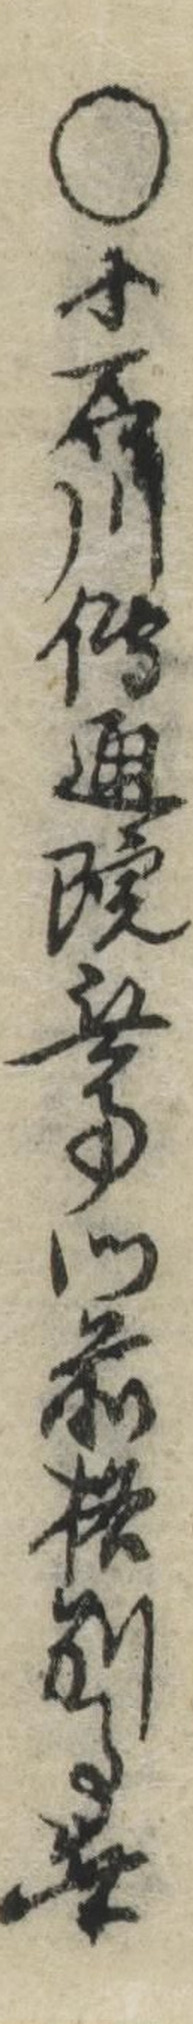〇小石川傳通院無事門前格別事無
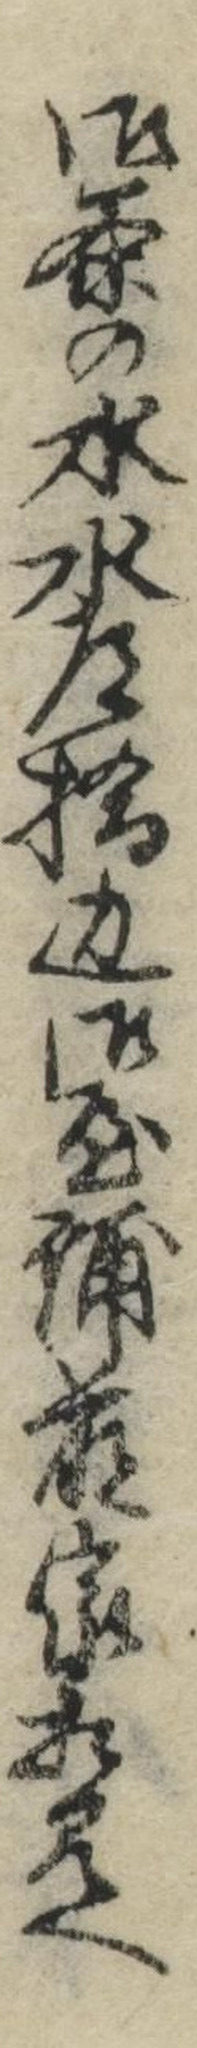御茶の水水道橋辺御屋舗崩家相見へ
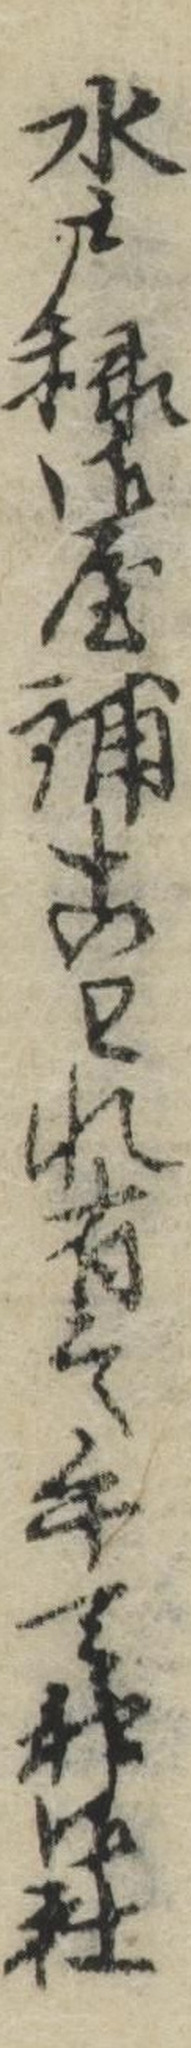水戸様御屋舗こわれ有之牛天神御社
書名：安政三年辰八月廿五日夜　大江都御屋敷方寺社市中共　大嵐水入場所明細書之寫　并街道筋近郷聞書
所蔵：東京大学地震研究所図書室 Earthquake Research Institute Library, The University of Tokyo, JAPAN
